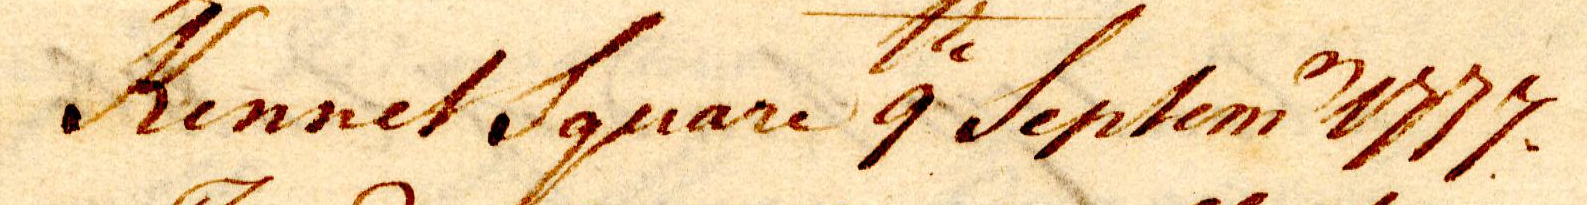Kennet Square 9^th Septem^r 1777.
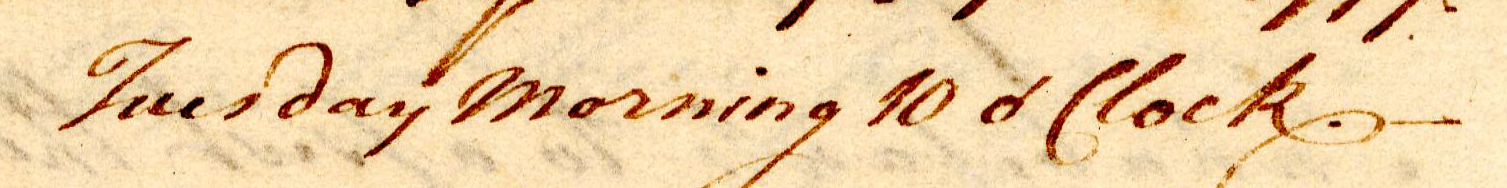Tuesday Morning 10 o'Clock.-
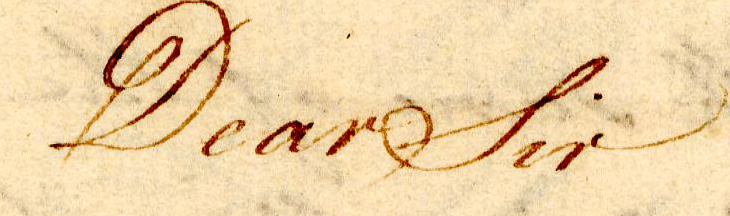Dear Sir
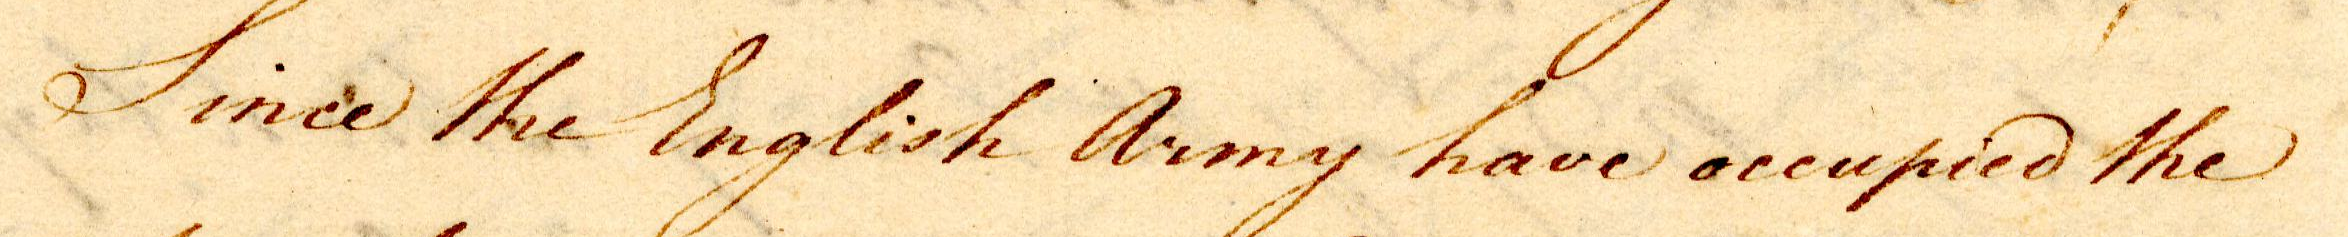Since the English Army have occupied the
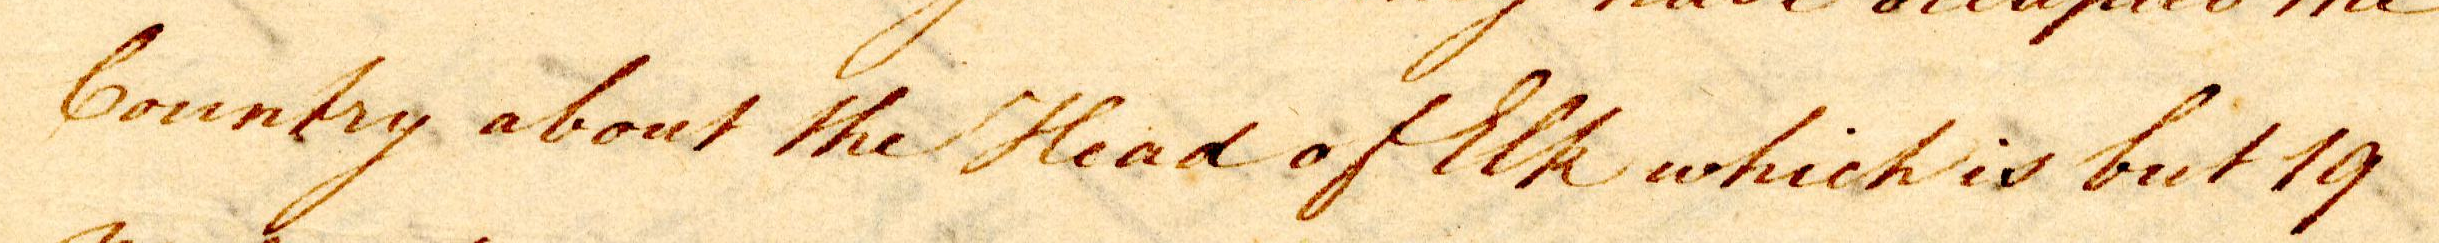Country about the Head of Elk which is but 19
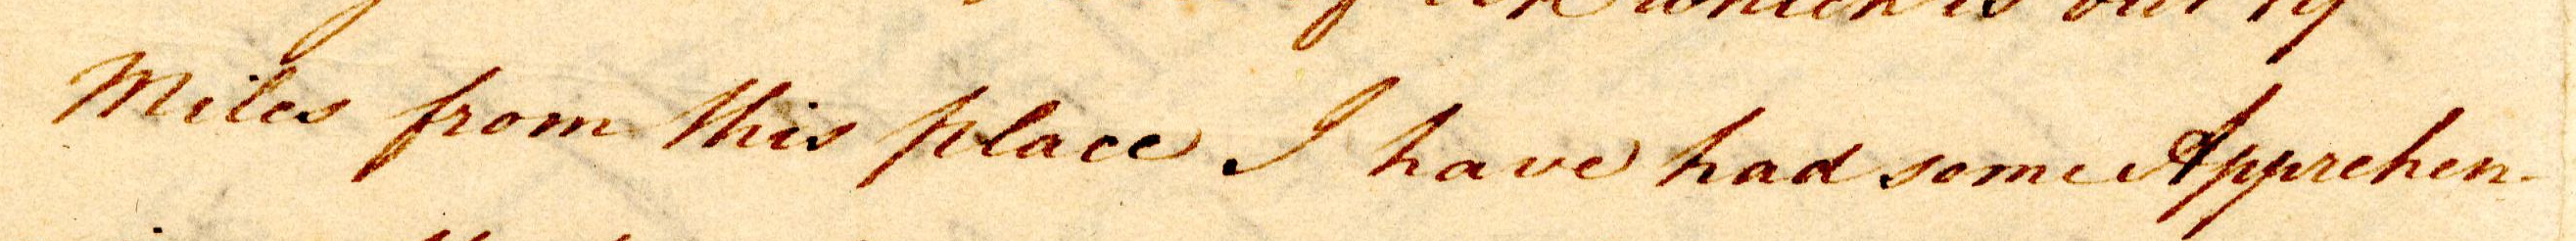Miles from this place I have had some Apprehen-
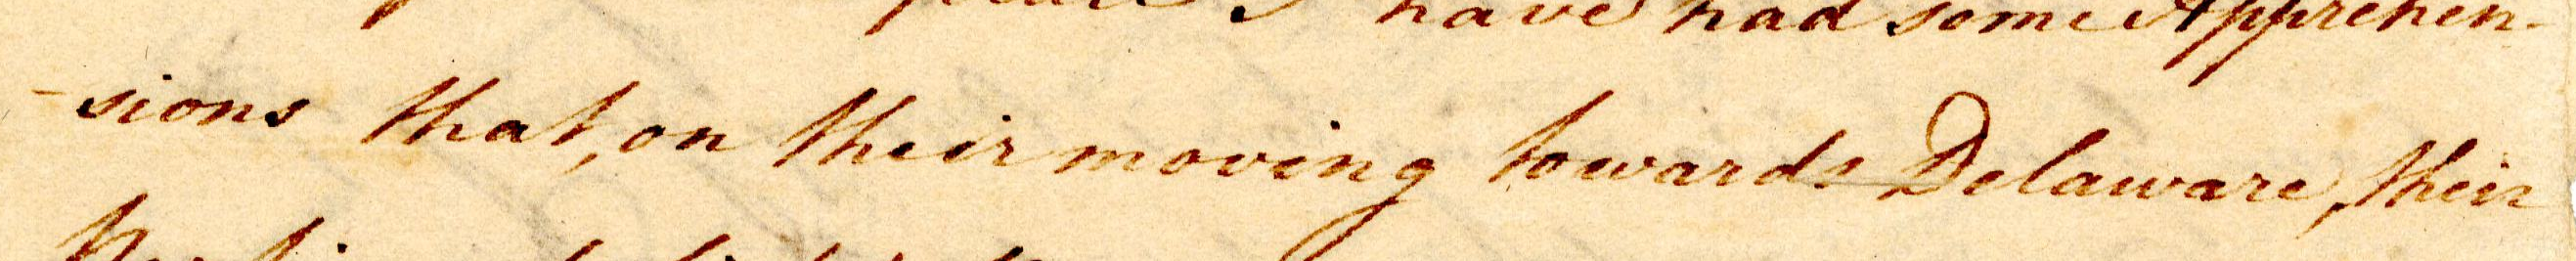-sions that, on their moving towards Delaware, their
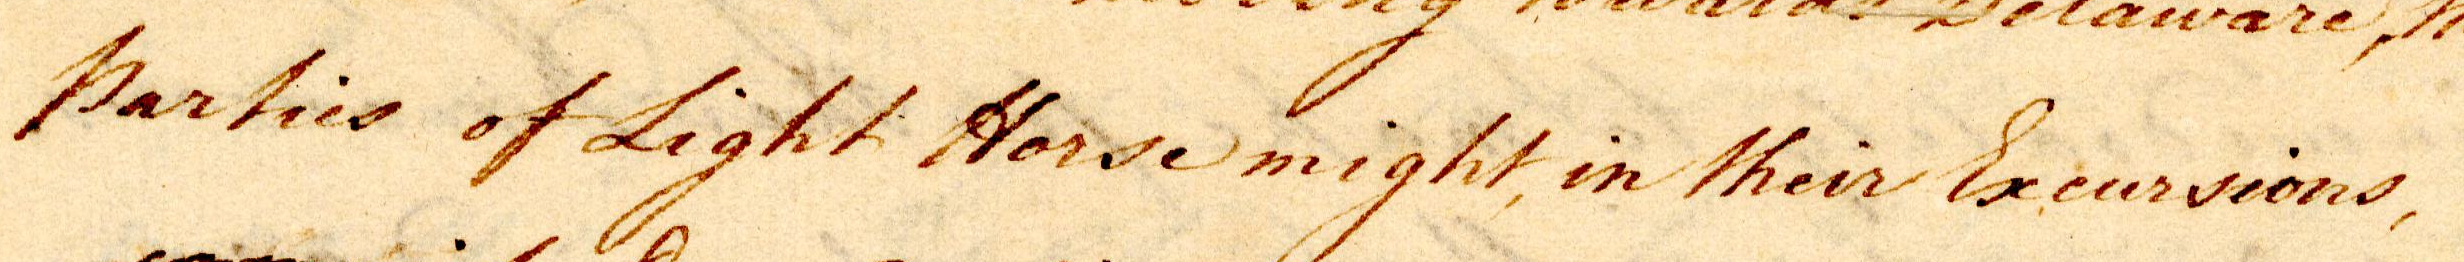Parties of Light Horse might in their Excursions,
